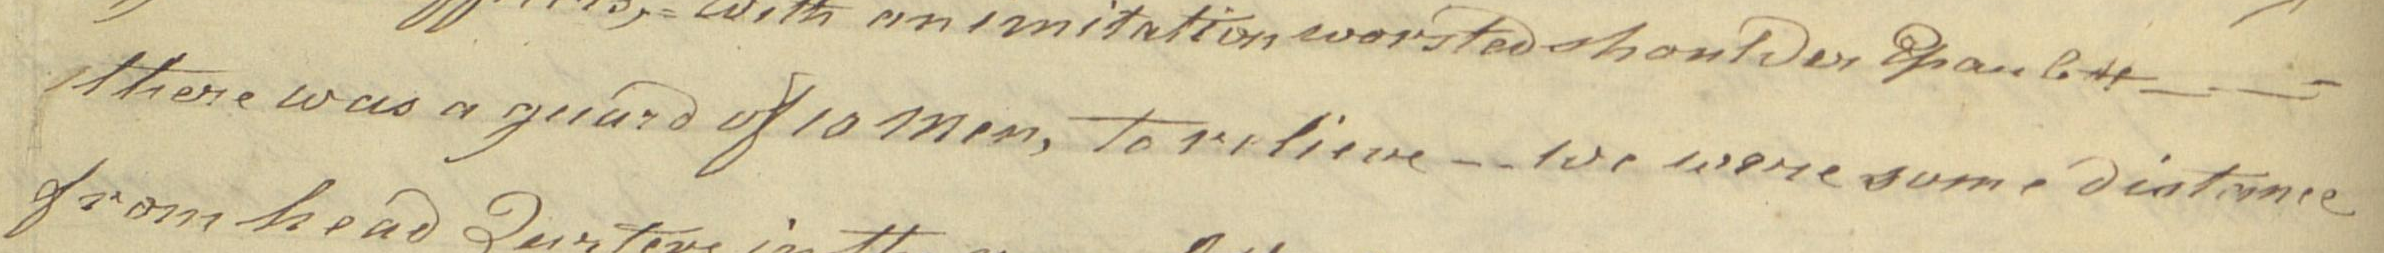there was a guard of 10 Men, to relieve- We were some distance
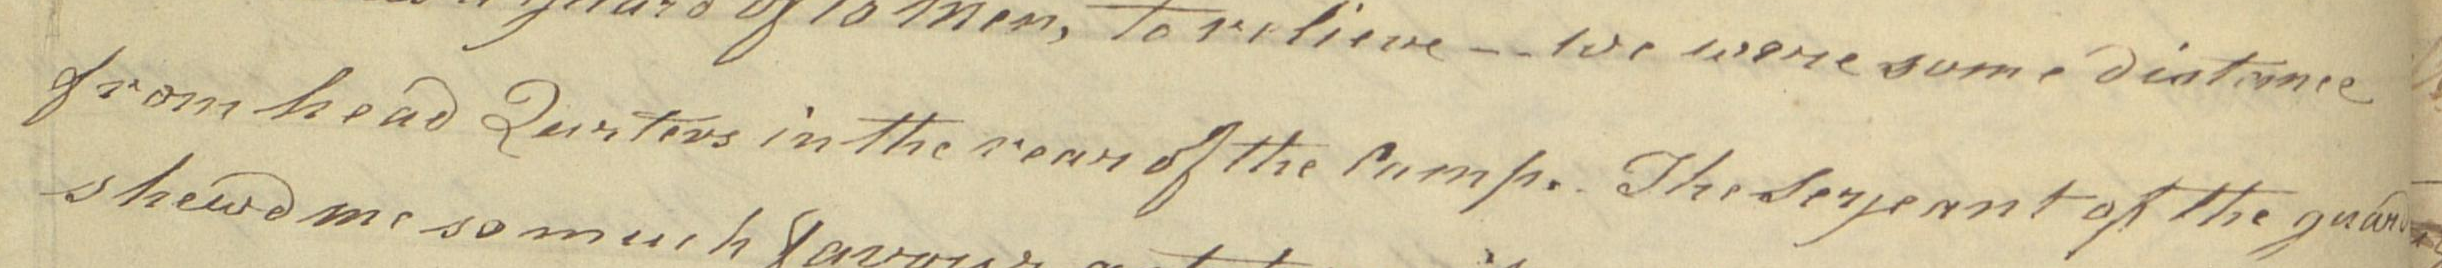from head Quarters in the rear of the Camp. The Serjeant of the guard
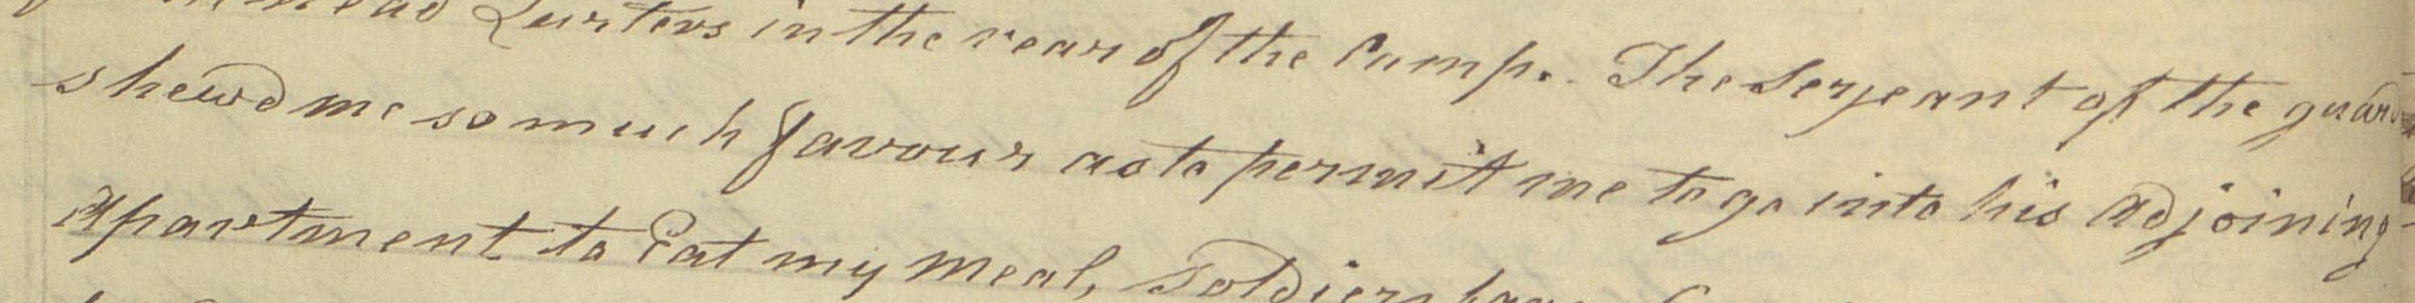shewd me so much favour as to permit me to go into his adjoining
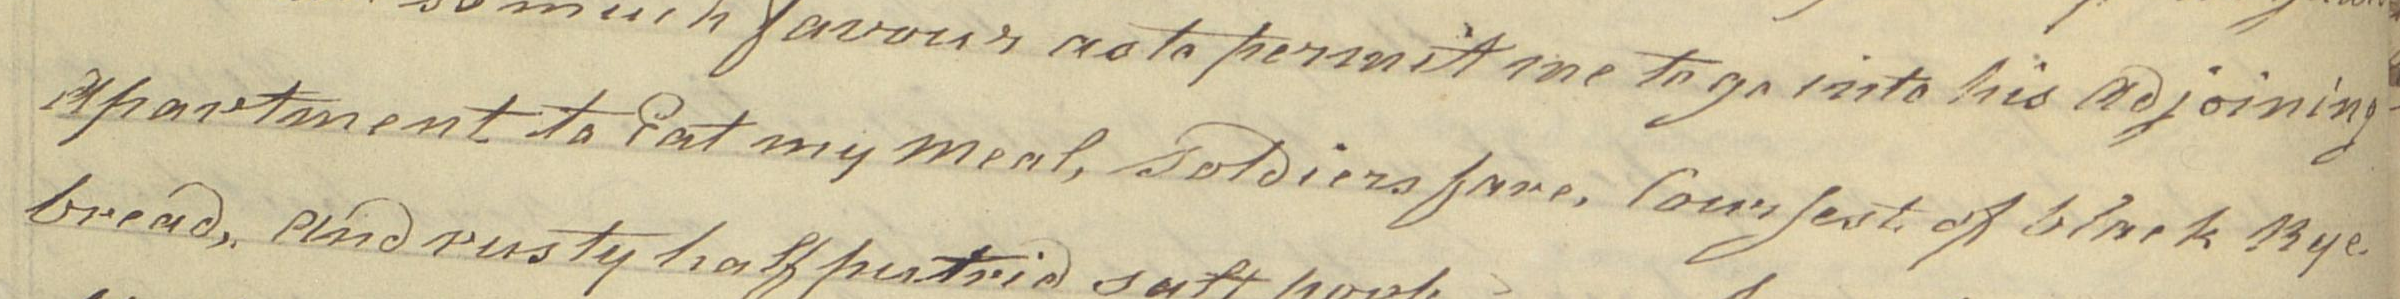Apartment to Eat my meal, soldiers fare, sour fest of black Rye
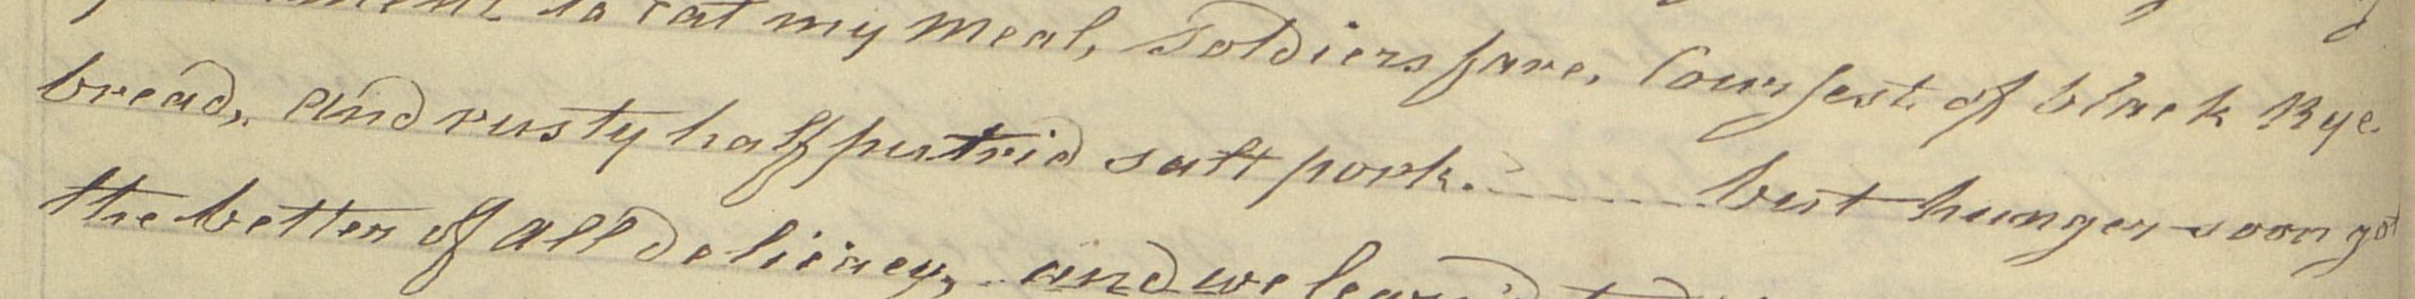bread, and rusty half putrid soft pork. but hunger soon go-
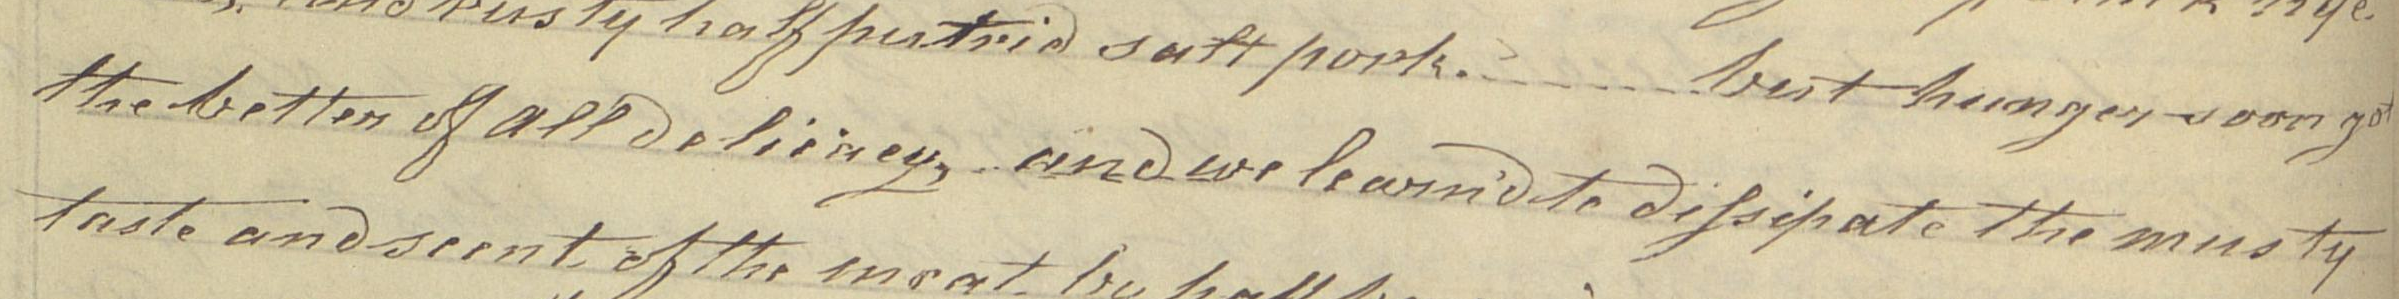the better of all delicacy, and we learnd to dissipate the musty
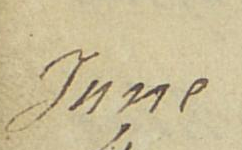June
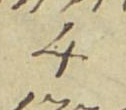4
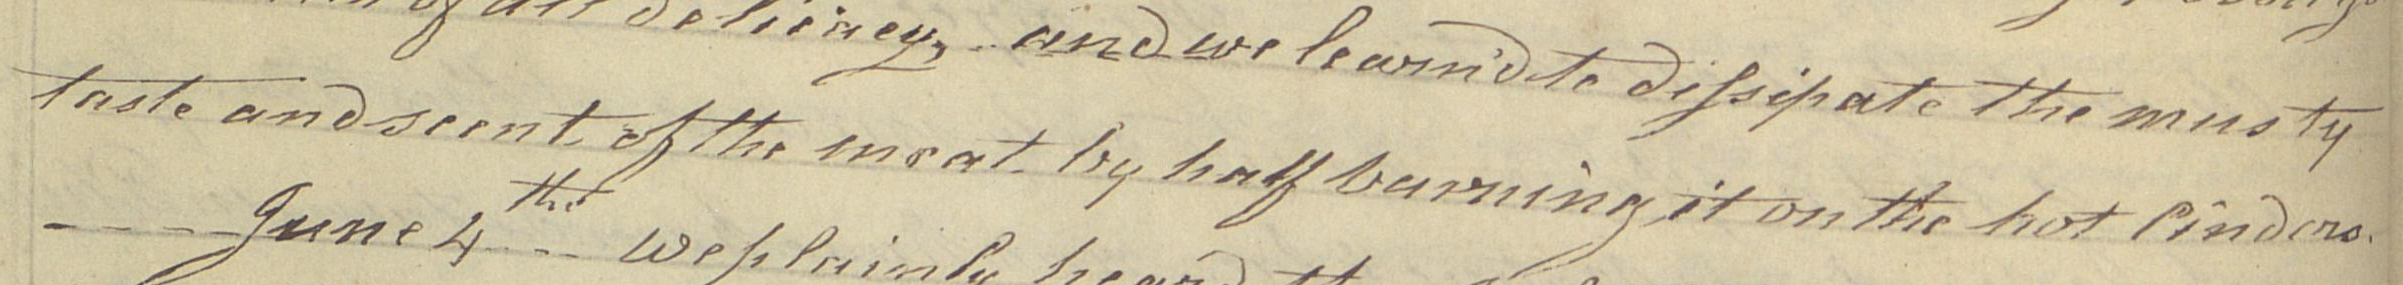taste and scent of the meat by half burning it on the hot Cinders
